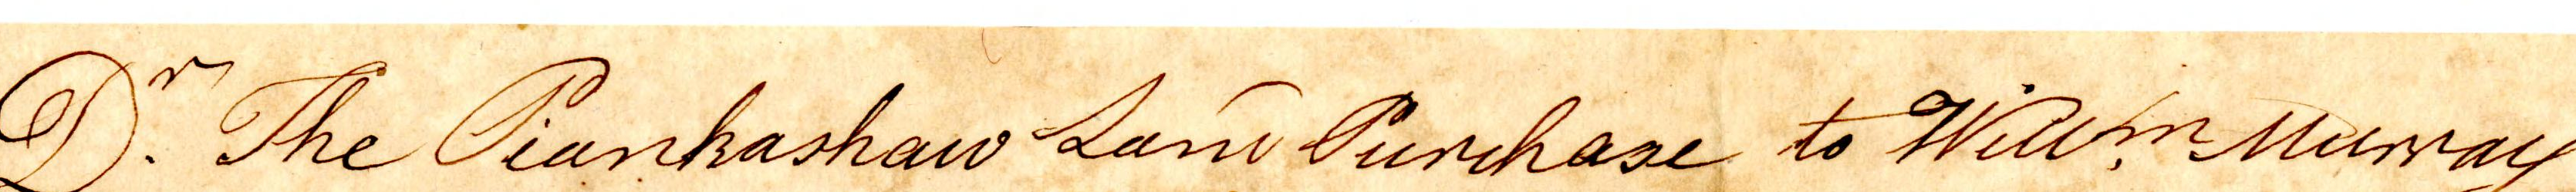Dr. The Piankashaw Land Purchase to Will^m Murray
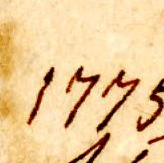1775
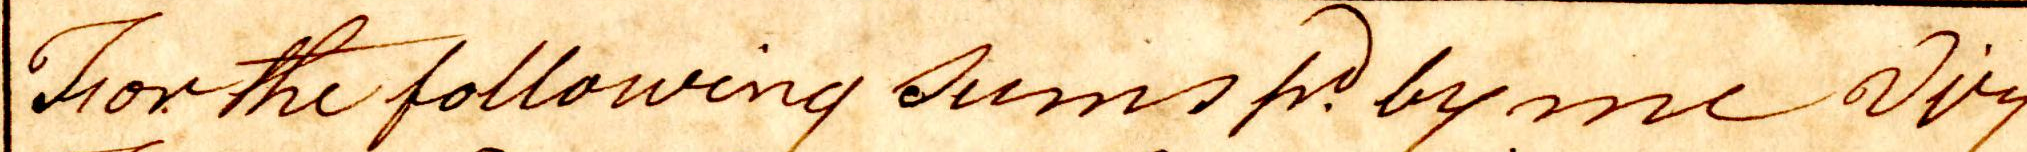For the following purchas^d. by me Viz
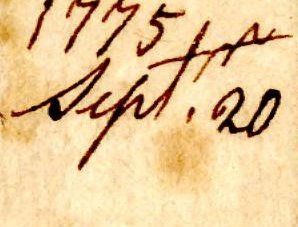Sept^r. 20
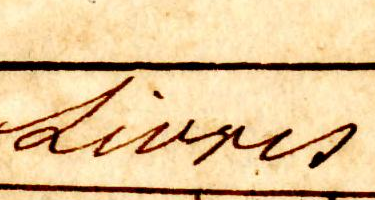Livres
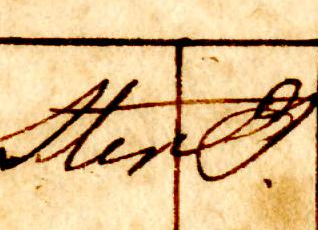Ster^g.
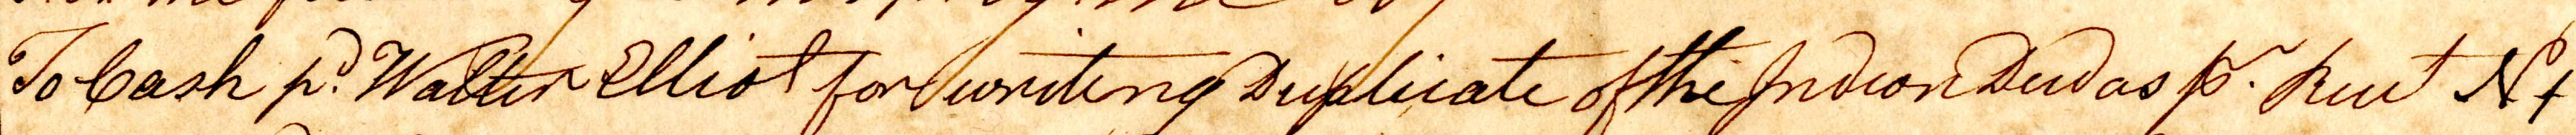To Cash p^d. Walter Elliot for writing duplicate of the Indian Deed as p^r. Rec^t Nt
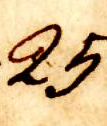25
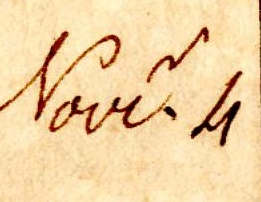Nov^r. 4
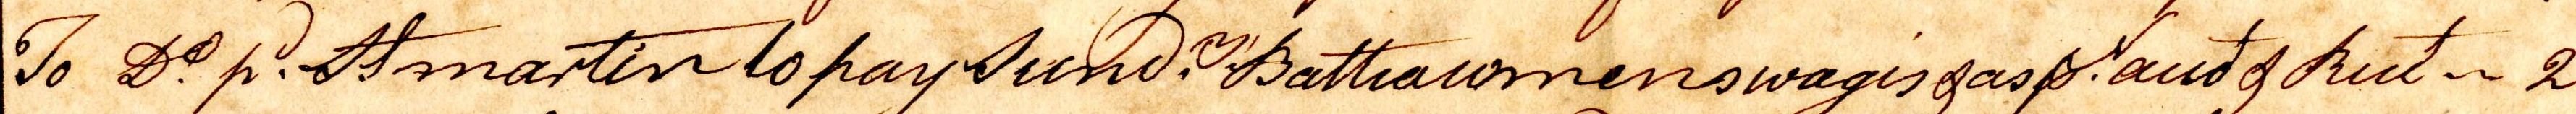To D^o. p^d. St Martin to pay sund^ry. Batteau mens wages & as p^r. acco^t. & rec^t 2
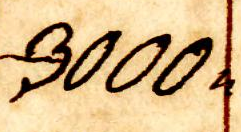3000
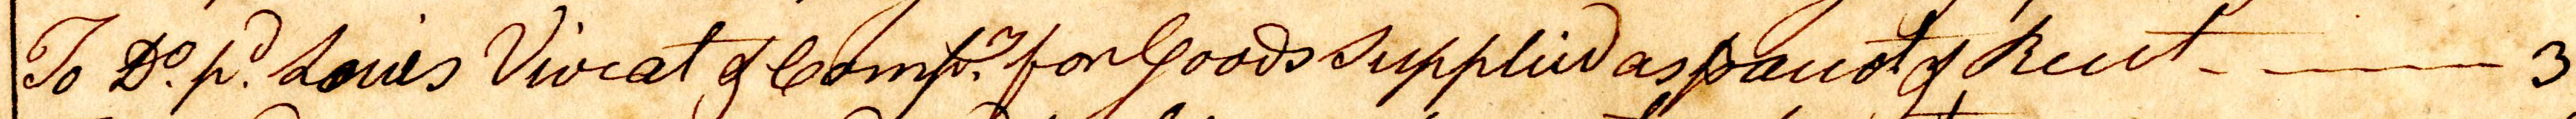To D^o. p^d. Louis Vivcat & Comp^y. for Goods Supplied as per acco^t rece^t.--3
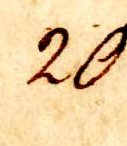20
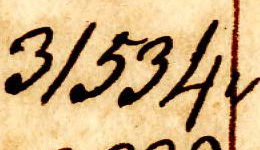3s534
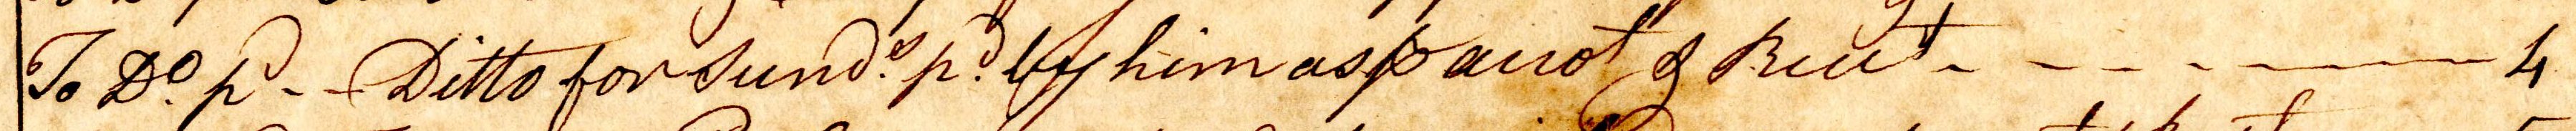To D^o. p^d- Ditto for sund^s. p^d. by him as per acco^t & Rece^t.----- 4
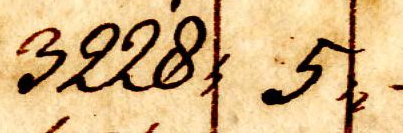3228 5
